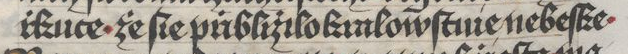ṙkuce.że ſie pribliżilo kralowſtuíe nebeſke.
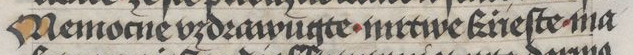Nemocne vzdrawugte.mrtwe kṙieſte.ma¬
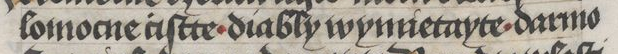lomocne ċiſtie.díably wymietayte.darmo¬
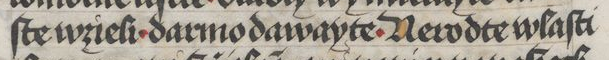ſte wzieli.darmo dawayte.Nerodte wlaſti
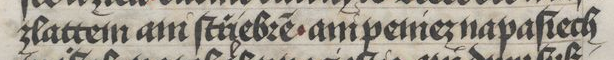zlattem ani ſtṙíebrē.ani peniez napaſiech
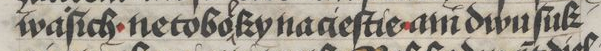waẛich.netobolky na cieſtie.ani dwu ſuk¬
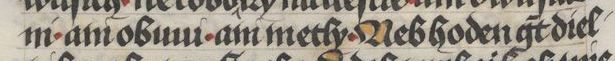ní.ani obuui.ani metly.Neb hoden ḡt díel¬
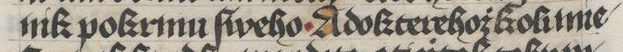nik pokrmu ſweho.A dokterehoż koli mie¬
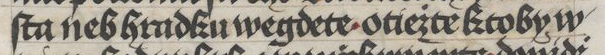ſta neb hradku wegdete.otieżte ktoby w
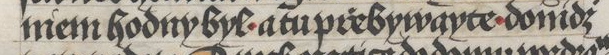niem hodny byl.a tu pṙebywayte.donidż
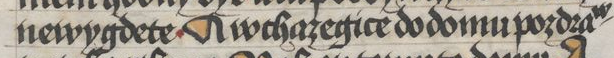newygdete.A wchazegice do domu pozdraw¬
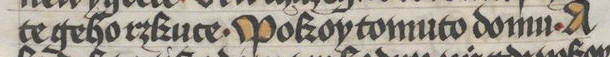te geho rzkuce.Pokoy tomuto domu.A
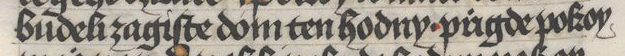budeli zagiſte dóm ten hodny.pṙigde pokoy
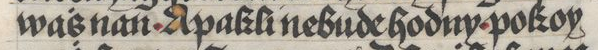waṡ nan.A pakli nebude hodny.pokoy
